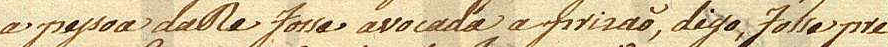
a pessoa da Re fosse avocada a prizaõ, digo, fosse pre
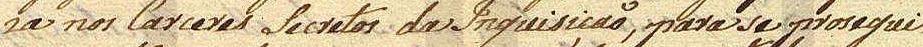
za nos Carceres secretos da Inquisiçaõ, para se prosegui
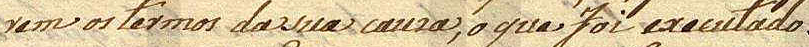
rem os termos da sua cauza, o que foi executado.
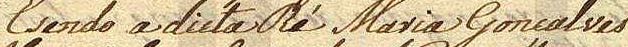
E sendo a dicta Ré Maria Gonçalves
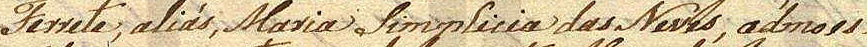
Ferrete, aliás, Maria Simplicio das Neves, admoes
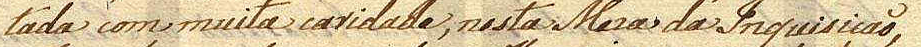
tada com muita caridade, nesta Meza da Inquisiçaõ,
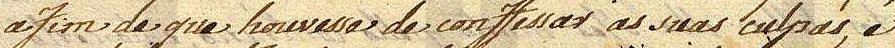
afim de que houvesse de conffessar as suas culpas, e
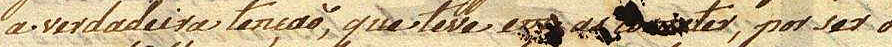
a verdadeira tençaõ, que teve e_ as __ter, por ser o
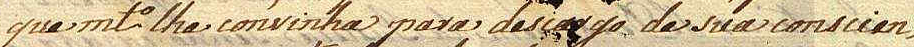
que mto lhe convinha para descargo de sua conscien
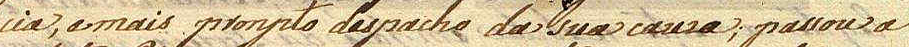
cia, e mais prompto despacho da sua cauza; passou a
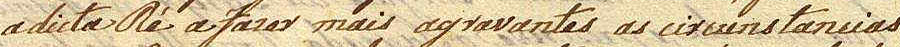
a dicta Ré a fazer mais agravantes as circunstancias
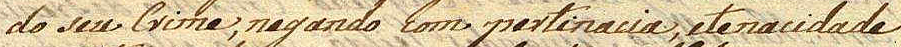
do seu Crime, negando com pertinacia, e tenacidade,
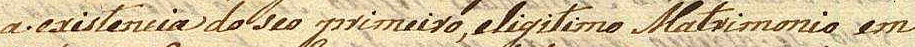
a existencia do seo primeiro, e ligitimo Matrimonio em
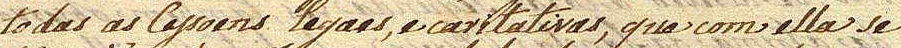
todas as Cessoens legaes, e caritativas, que com ella se
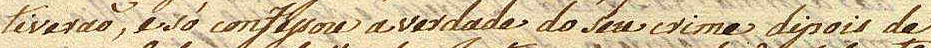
tiveraõ, e só confessou a verdade do seu crime dipois de
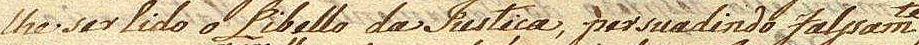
lhe se lido o Libelo da Iustiça, persuadindo falssamte,
